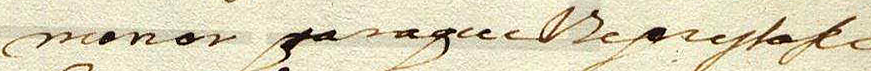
menor para que lhe prestasse
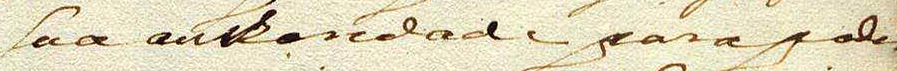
sua authoridade para poder
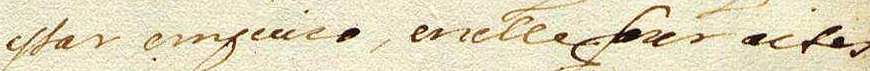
estar em juizo, e nelle fazer actos
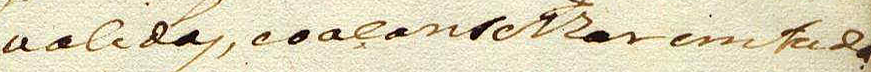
ualidos, e o aconselhar em tudo
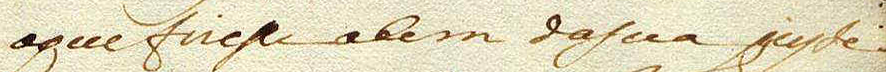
o que fizesse a bem da sua justi
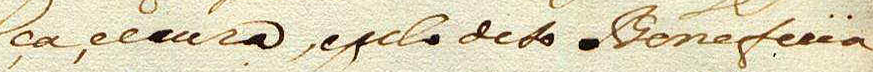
ça, e cauza, e pelo dito Benefecia
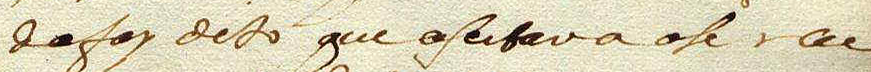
do foy dito que aseitava o ser cu
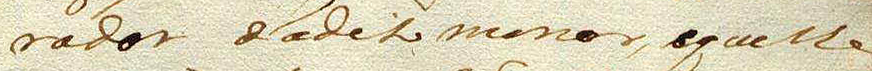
rador do dito menor, e que lhe
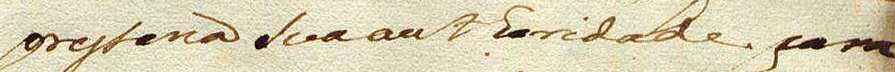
prestaua sua authoridade, para
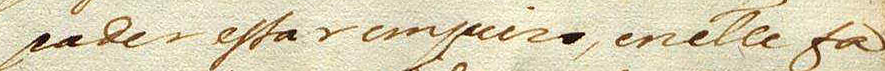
poder estar em juizo, e nelle fa
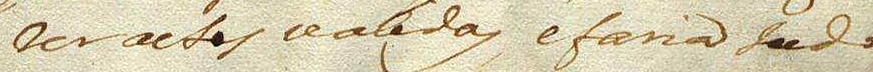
zer actos ualidos, e faria tudo
